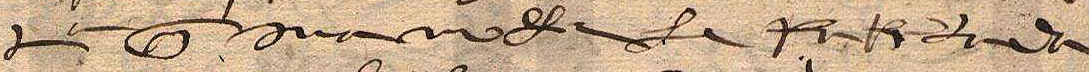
ta q̄ sua molher he paRēta da
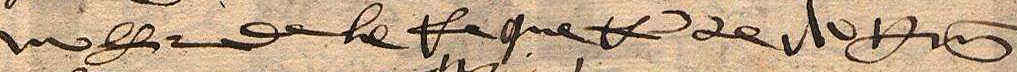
molher dele RequeRēte do gēz
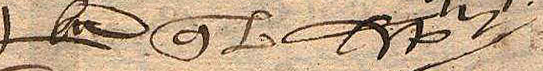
tbā q̄ ho Esp̄yy
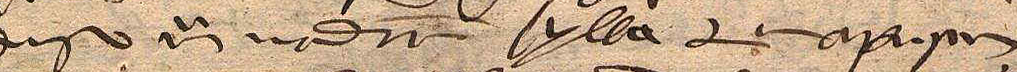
duso mo na dt̄a vylla ta apresen
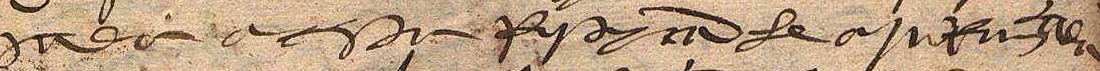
tada a Esta pytyçā he aJuRamtada
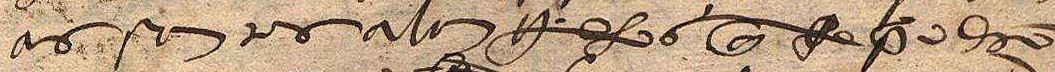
aos samtos avamgelhos q̄ lhe p̄o o dt̄o
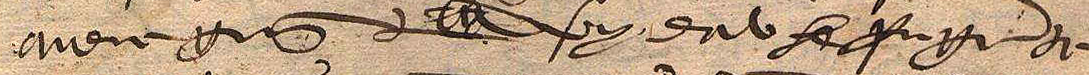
andre gēz tbā foy dado he pergūta
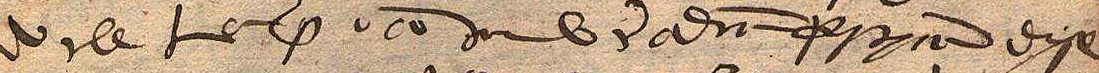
do ele ta p̄o o c̄oteudo ē a dt̄a pytyçā dyse
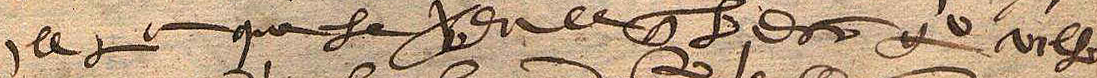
ell ta que he ꝟdade q̄ ho dt̄o go coelho
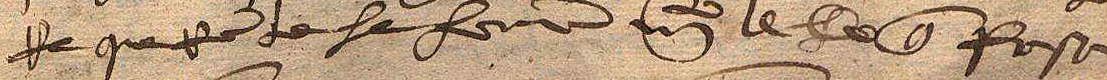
RequeRēte he homē mto velho q̄ pasa
